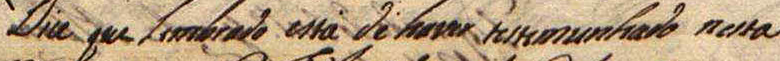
Dice que lembrado esta de haver testemunhado nesta
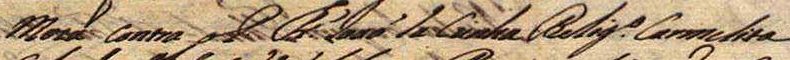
Meza contra o P. Fr̄. Ioaõ da Cunha Relig.o Carmelita
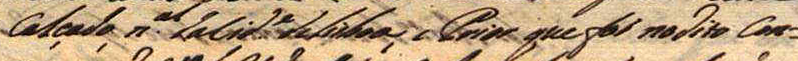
Calçado, n.al da Cid.e de Lisboa, e Prior que foi no dito Con
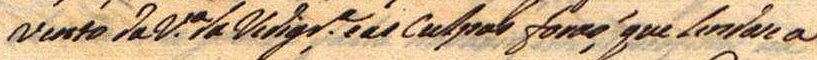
vento da V.a da Vidigr.a e as Culpas foraõ, que lendosse a
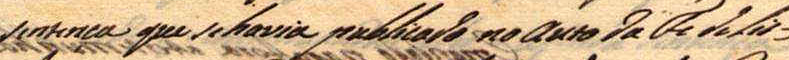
sentença que se havia publicado no auto da Fe de Lis
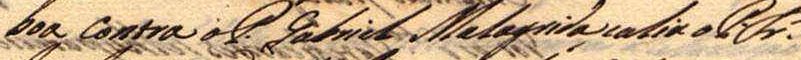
boa contra o P. Gabriel Malagrida, e a lia o P. Fr̄.
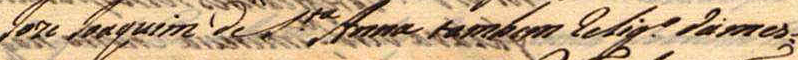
Ioze Ioaquim de S.ta Anna tambem Relig.o da mes
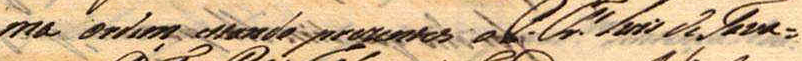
ma ordem, estando prezentes o P. Fr̄. Luis de Tava
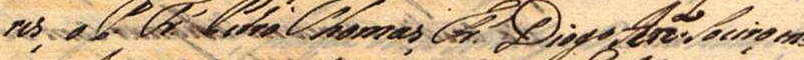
res, o P. Fr̄. Pedro Thomas, Fr̄. Diogo An.to Soeiro, en
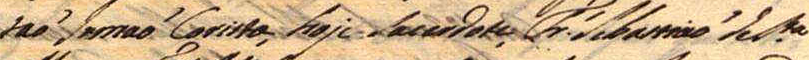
taõ Irmaõ Corista, hoje Sacerdote, Fr̄. Sebastiaõ de S.ta
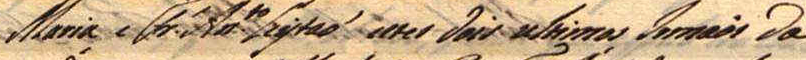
Maria, e Fr̄. An.to Leytaõ estes dois ultimos Irmaõs da
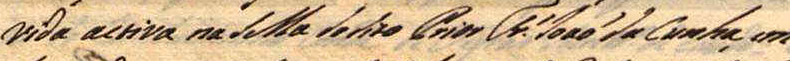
vida activa na Sella do dito Prior Fr̄. Ioaõ da Cunha, em
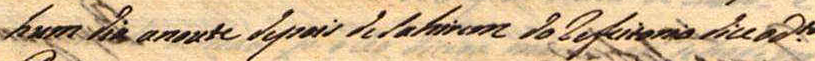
hum dia a noute depois de sahirem do Refeitorio dice o d.to
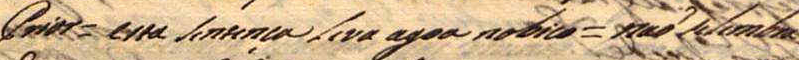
Prior = esta sentença leva agoa no bico = naõ se lembra
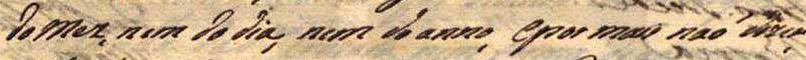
do mez, nem do dia, nem do anno, e por mais naõ dizia,
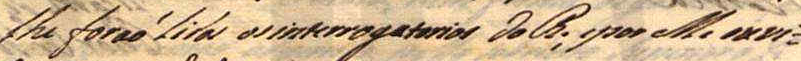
lhe foraõ lidos os interrogatorios do R; e por elle ouvi
